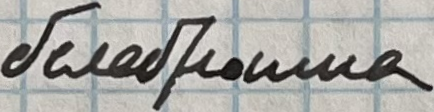белобрюшка
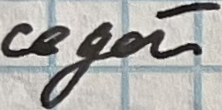седой
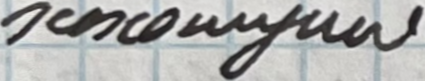хохотунья
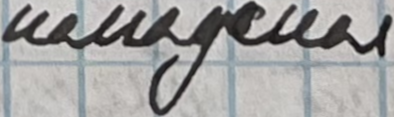канадская
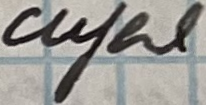сизая
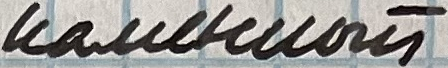каменный
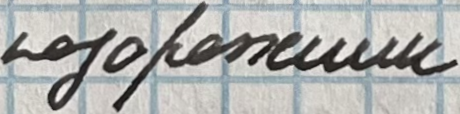подорожник
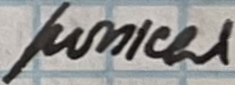рыжая
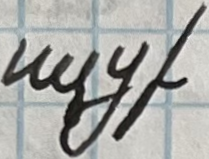щур
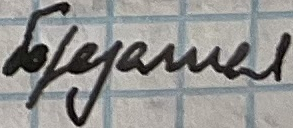бородатая
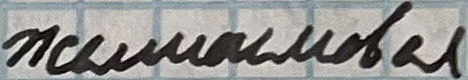желтоклювая
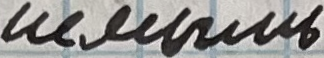неясыть
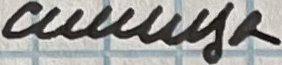синица
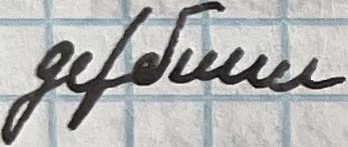дербник
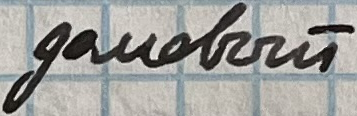домовый
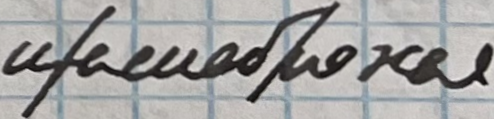краснобрюхая
